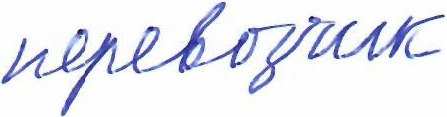перевозчик
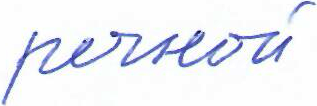речной
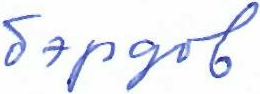бэрдов
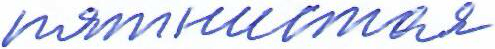пятнистая
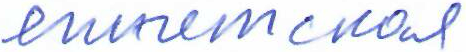египетская
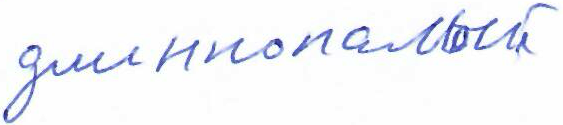длиннопалый
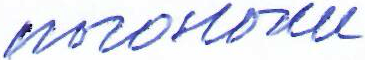погоныш
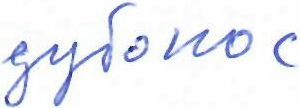дубонос
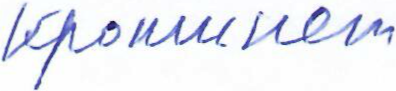кроншнеп
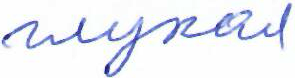глухая
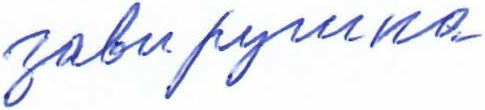завирушка
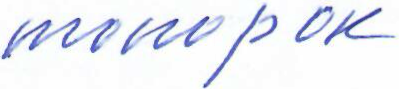топорок
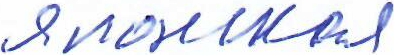японская
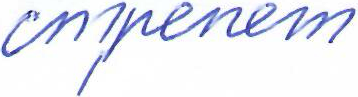стрепет
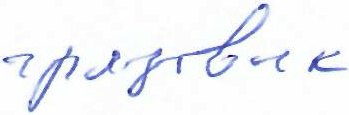грязовик
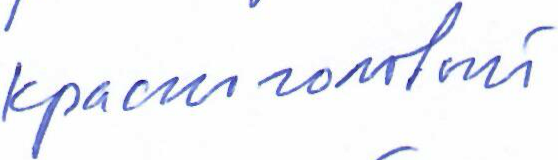красно головый
